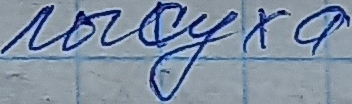лысуха
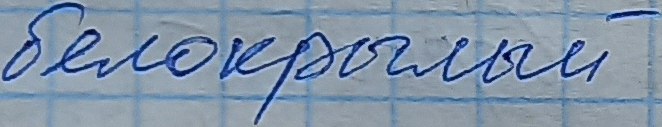белокрылый
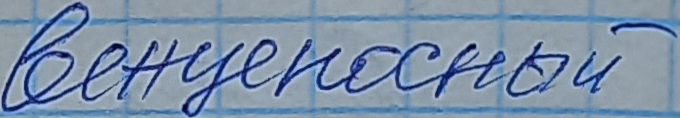венценосный
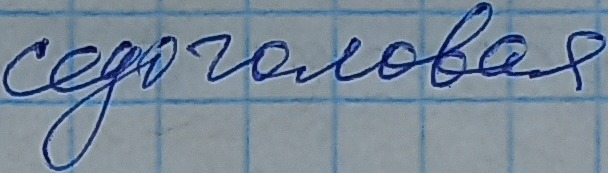седоголовая
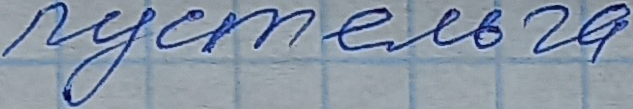пустельга
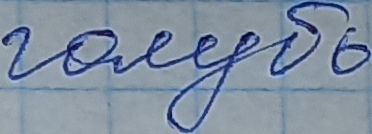голубь
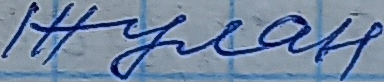жулан
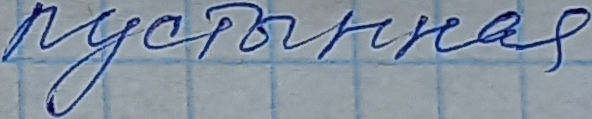пустынная
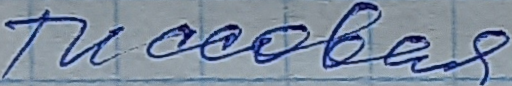тиссовая
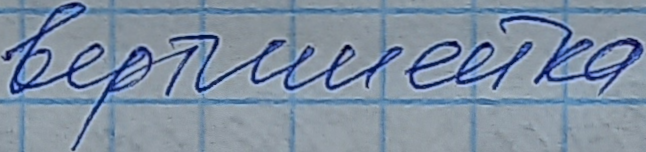вертишейка
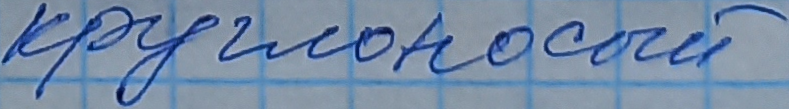круглоносый
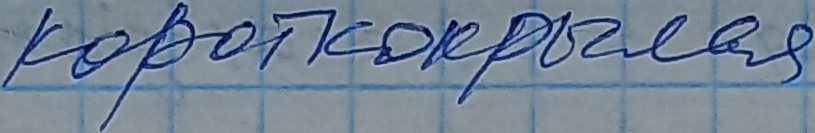короткокрылая
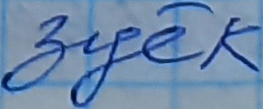зуёк
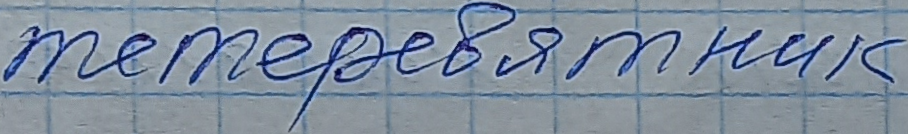тетеревятник
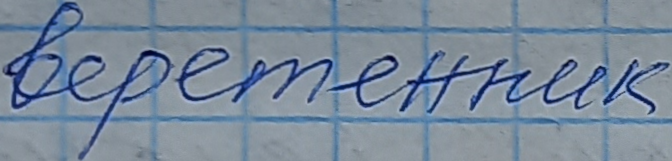веретенник
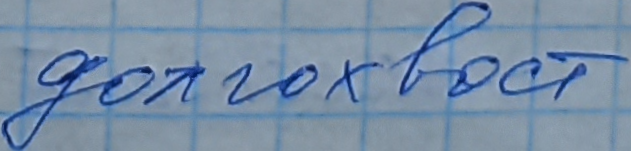долгохвост
